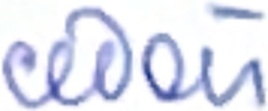седой
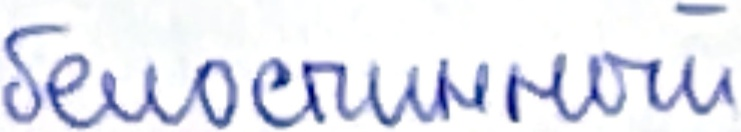белоспинный
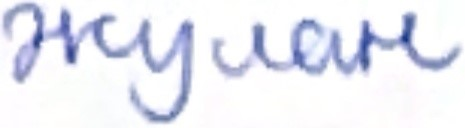жулан
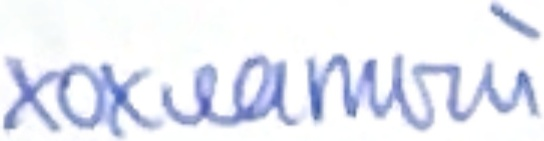хохлатый
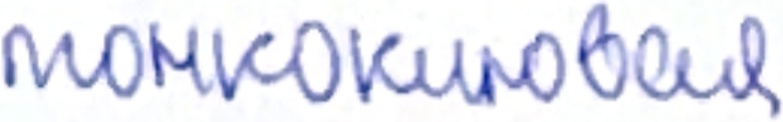тонкоклювая
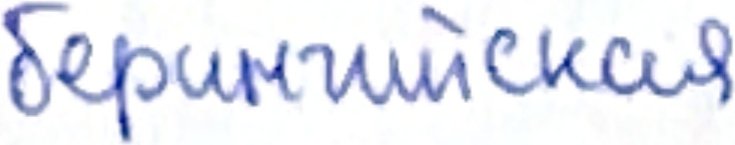берингийская
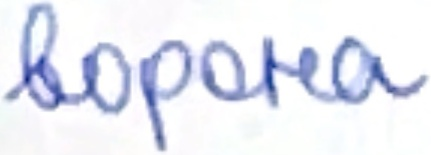ворона
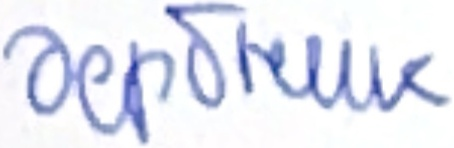дербник
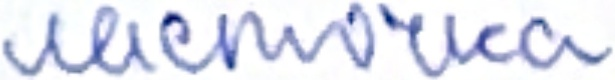ласточка
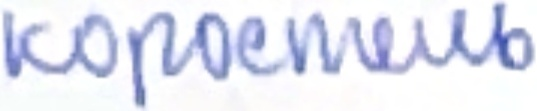коростель
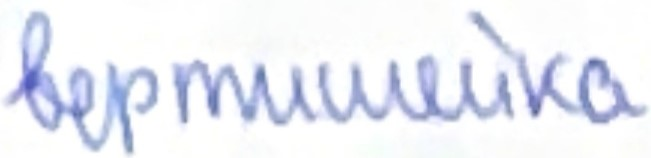вертишейка
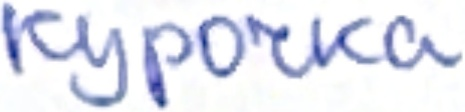курочка
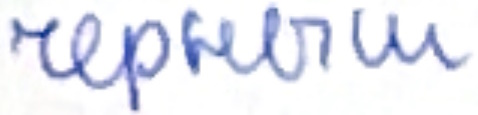черныш
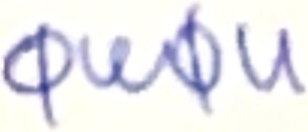фифи
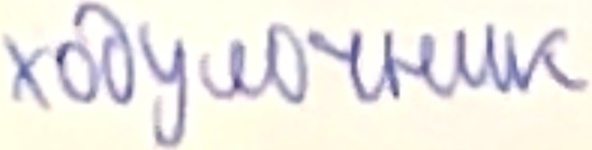ходулочник
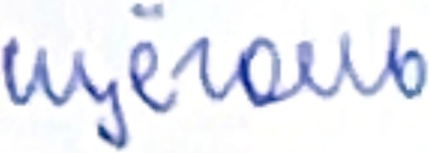щёголь
